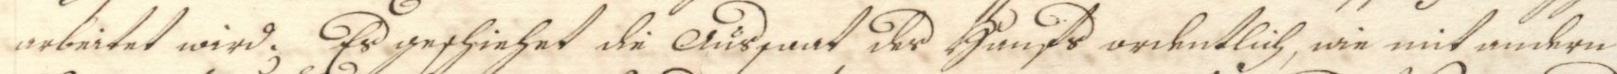arbeitet wird. Es geschiehet die Aussaat des Hanfs ordentlich, wie mit andern
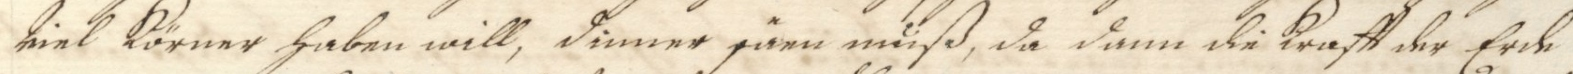viel Körner haben will, dinner säen muß, da dann die Krafft der Erde
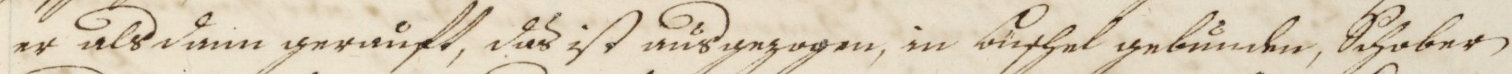er als dann gerauft, das ist ausgezogen, in Büshel gebunden, Schober
